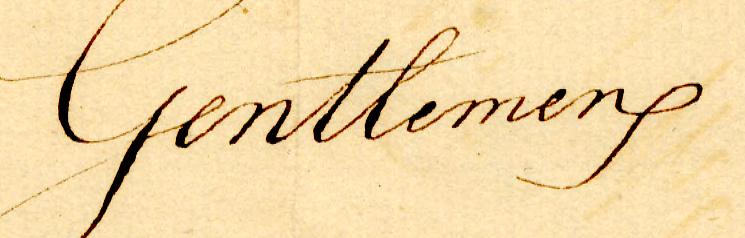Gentlemen
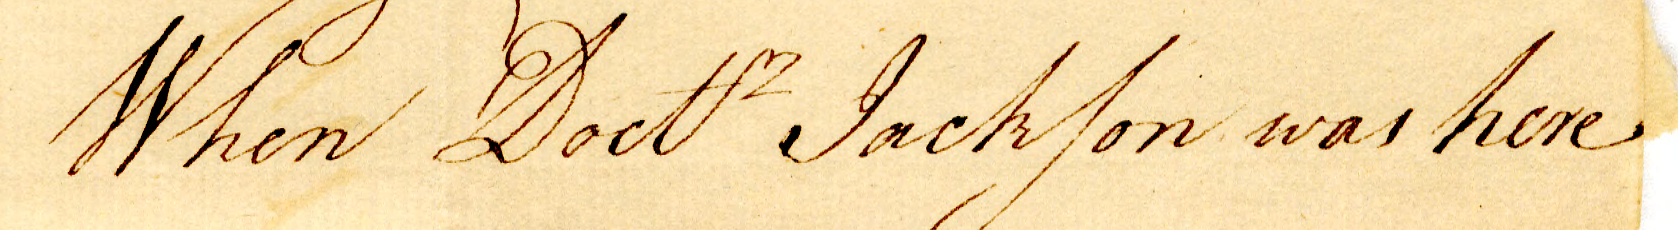When Doct^r Jackson was here
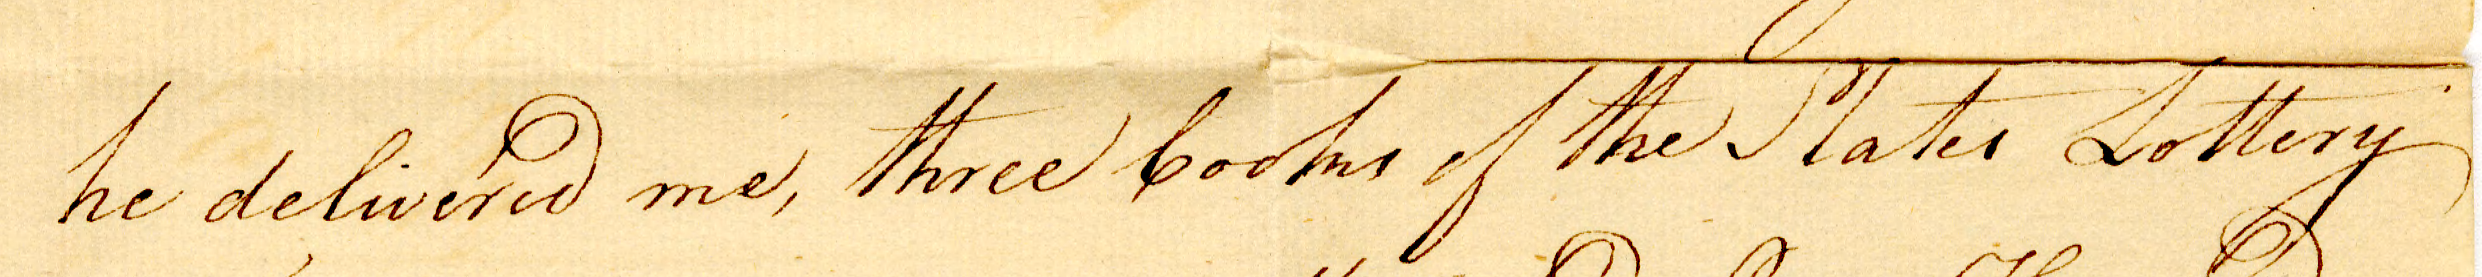he delivered me, three books of the States Lottery
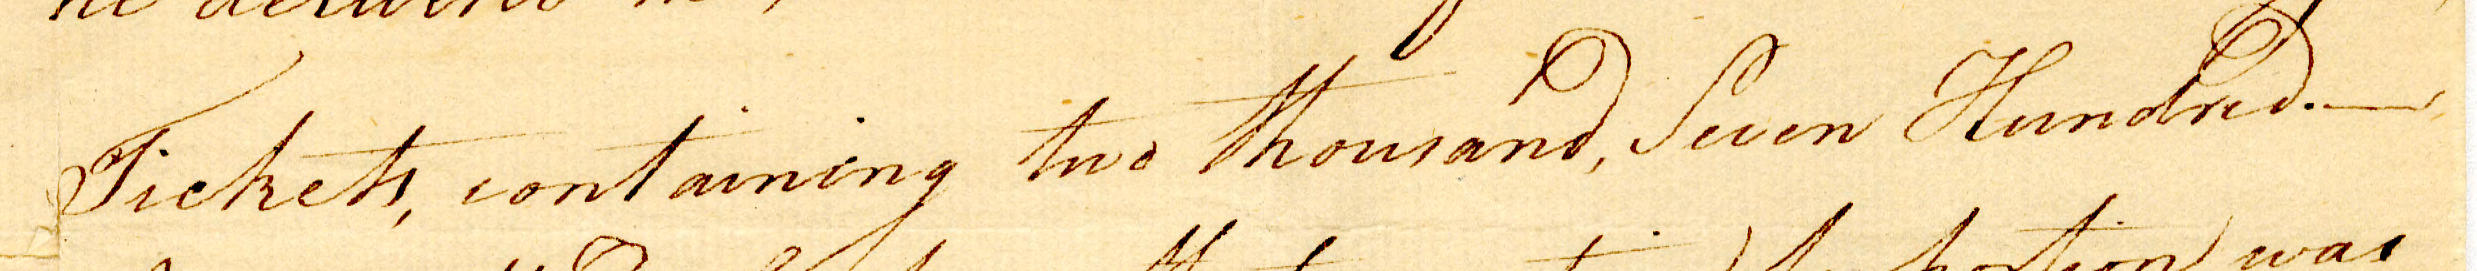Ticket, containing two thousand, seven Hundred.-
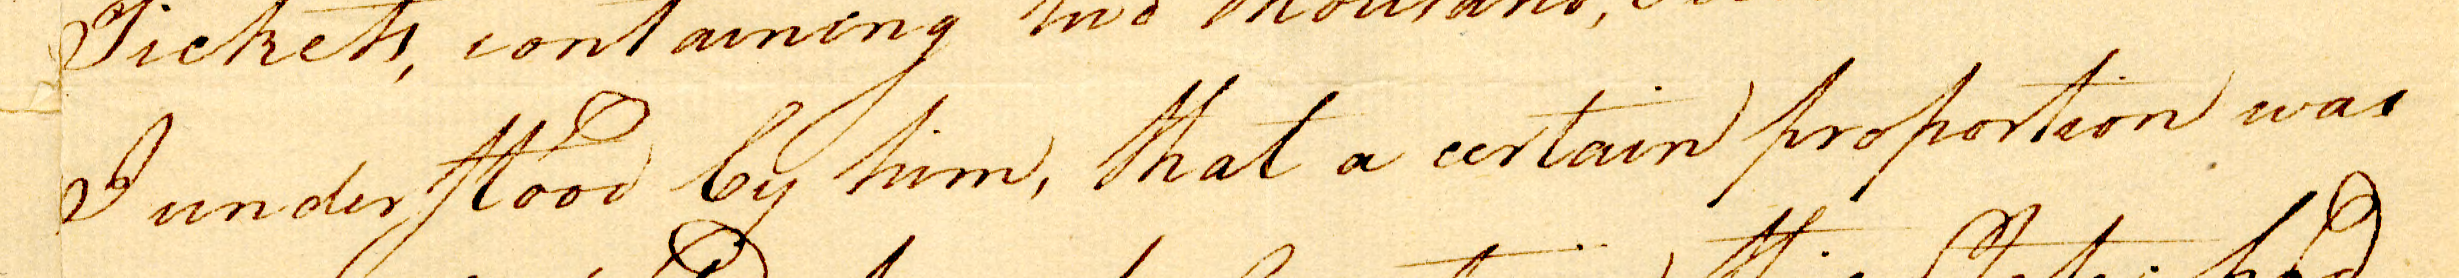I understood by him, that a certain proportion was
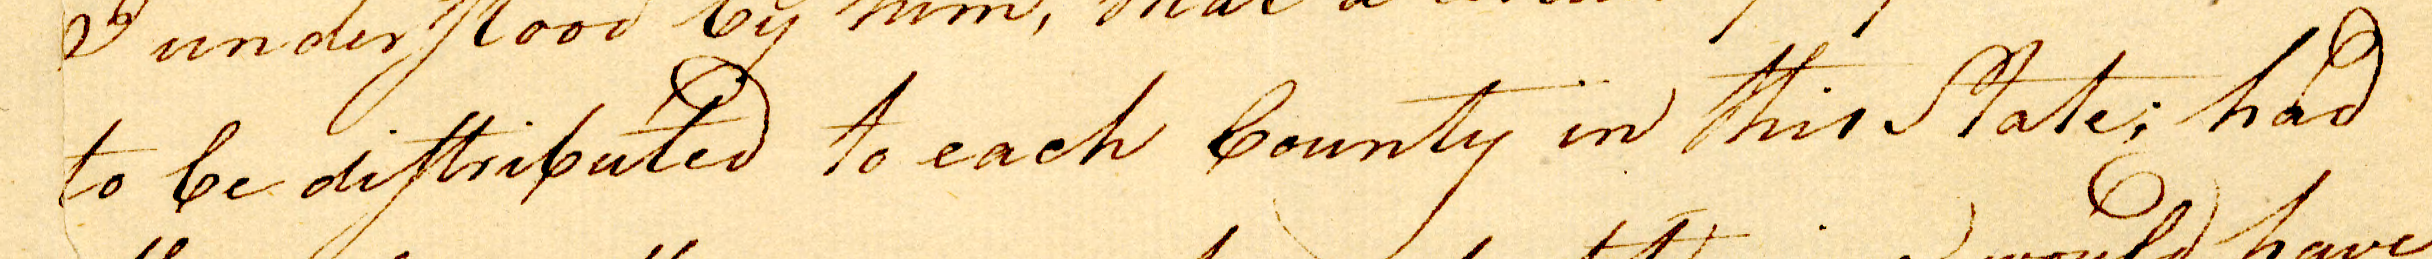to be distributed to each county in this State; had
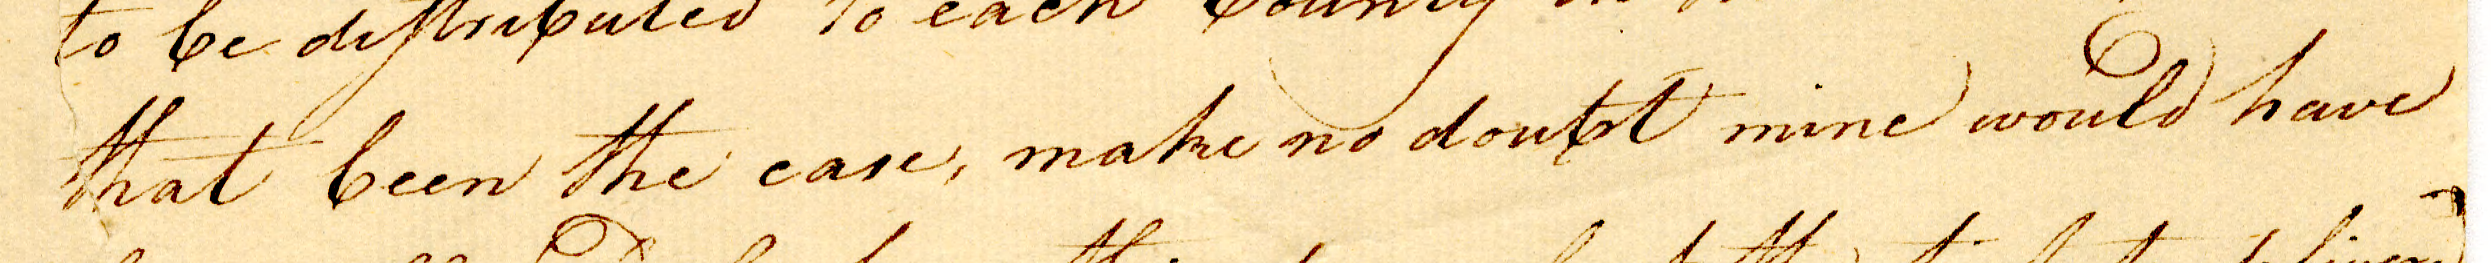that been the case, make no doubt mine would have
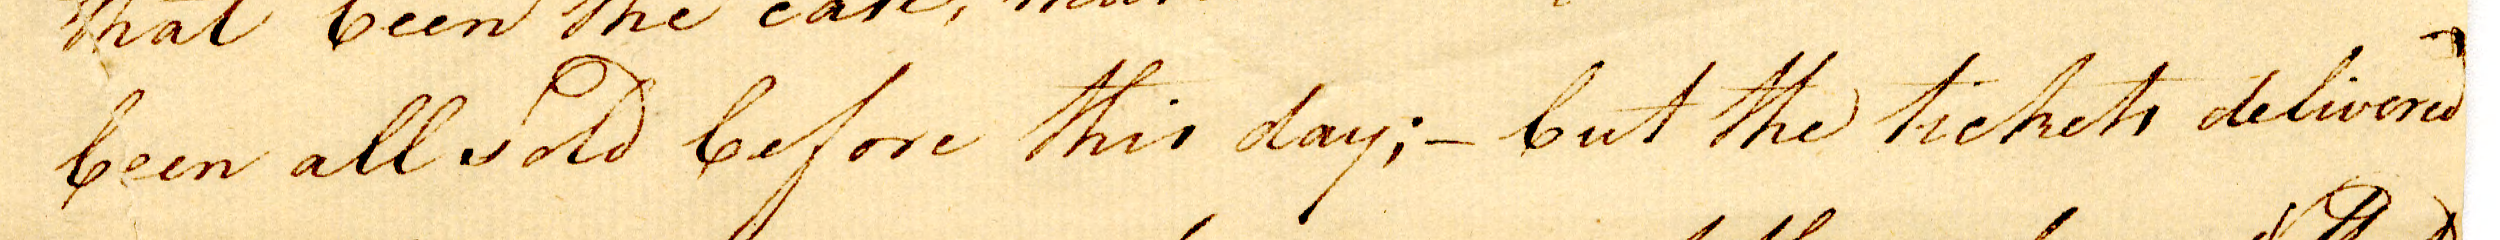been all sold before this day;- but the tickets delivered
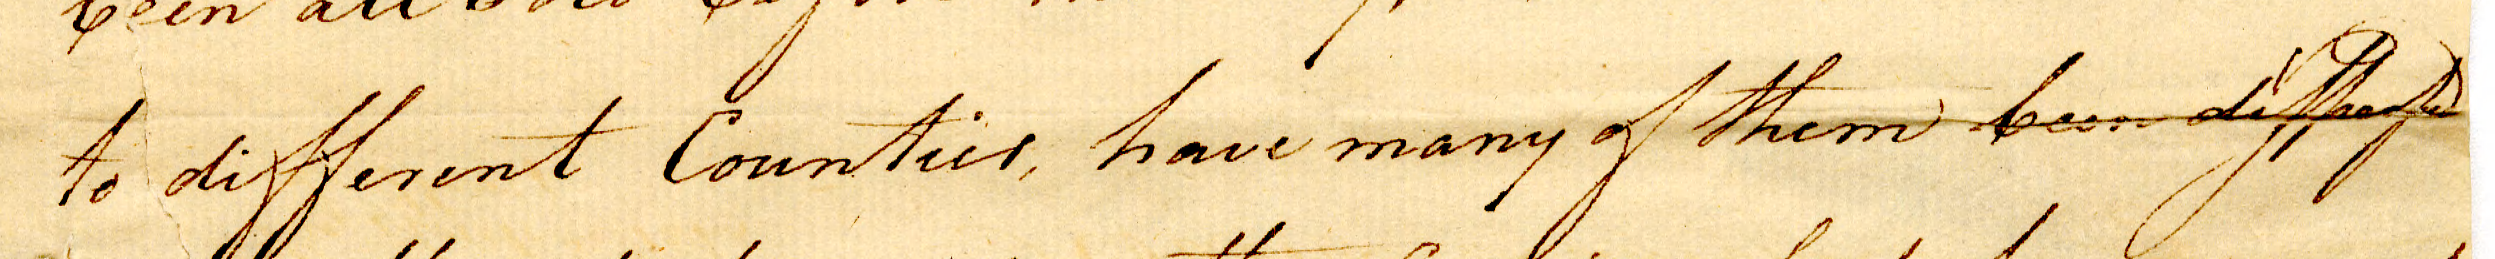to different counties have many of them been dispersed
